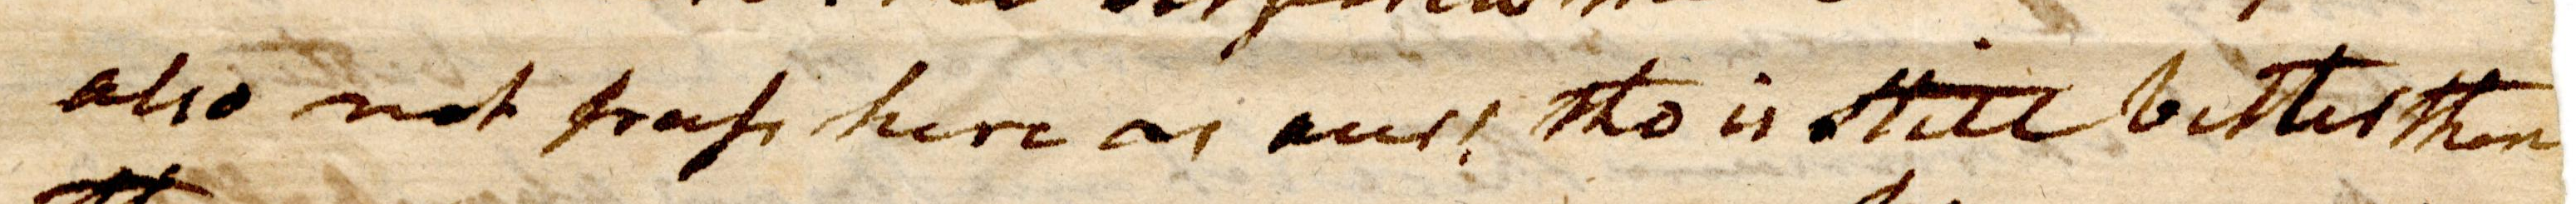also not pass here as ours, tho is still better than
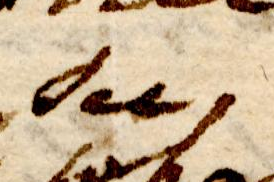see
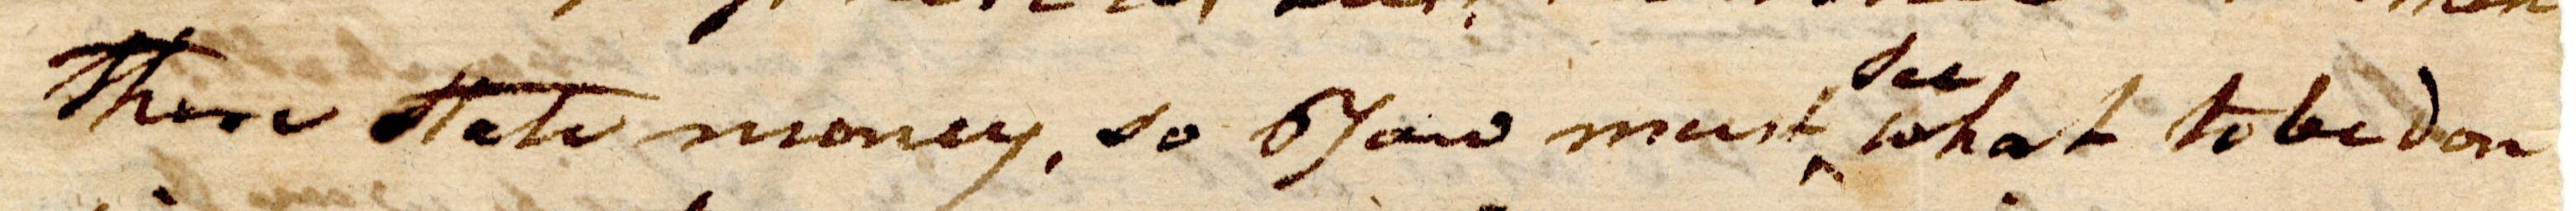There state money, so you must ^ what to be don
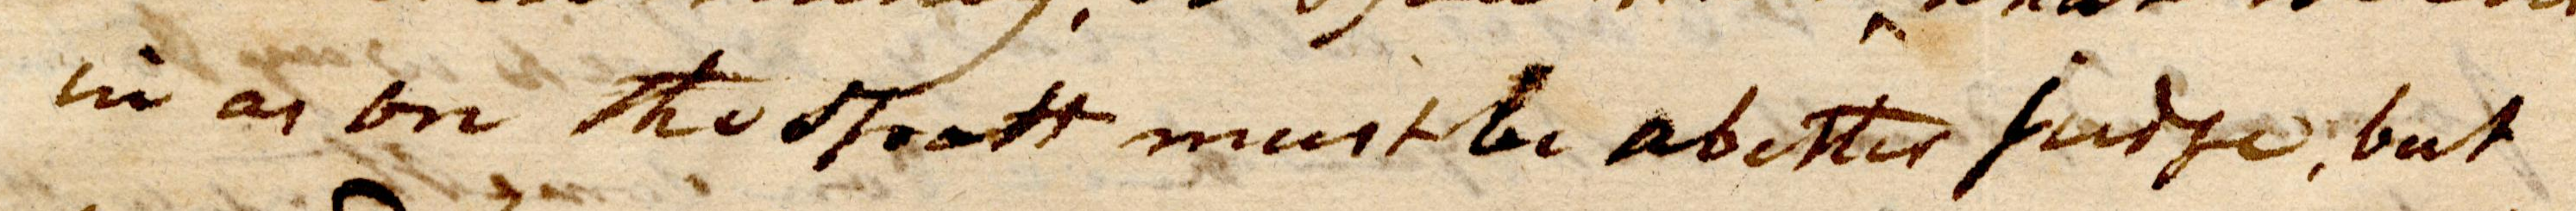in as on the spott must be a better prize, but
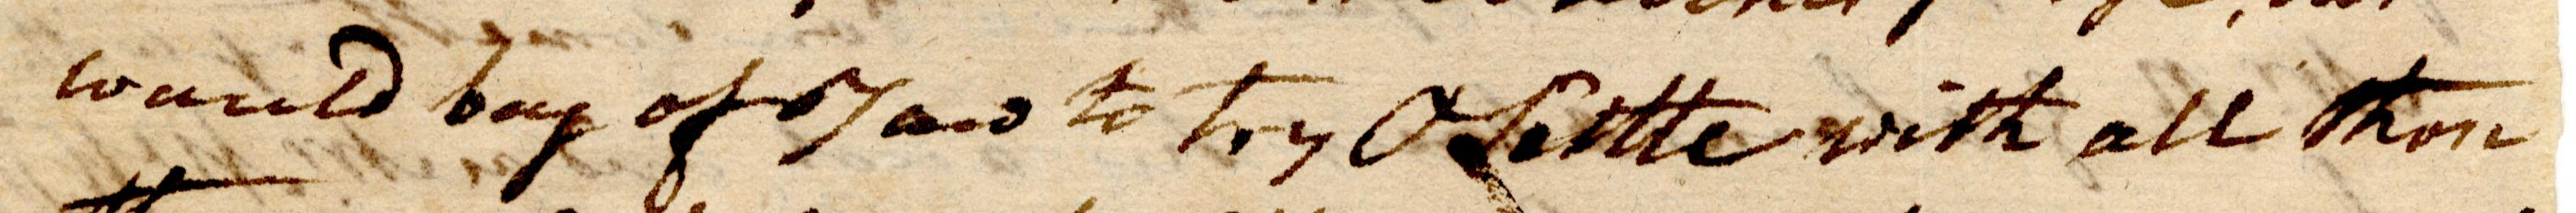would beg of you to try & settle with all those
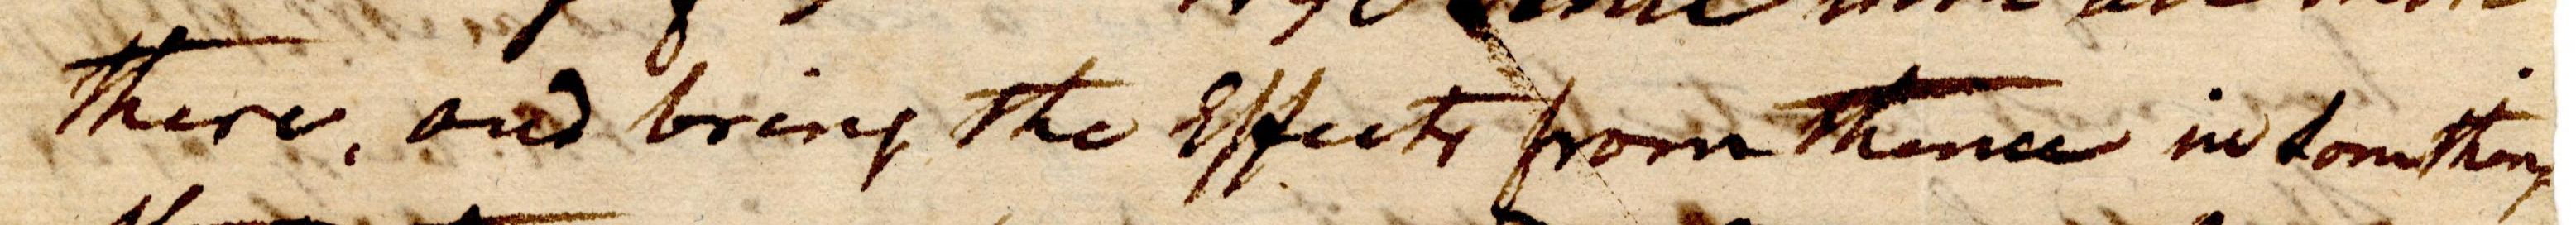there, and bring the Effects from thence in sometime
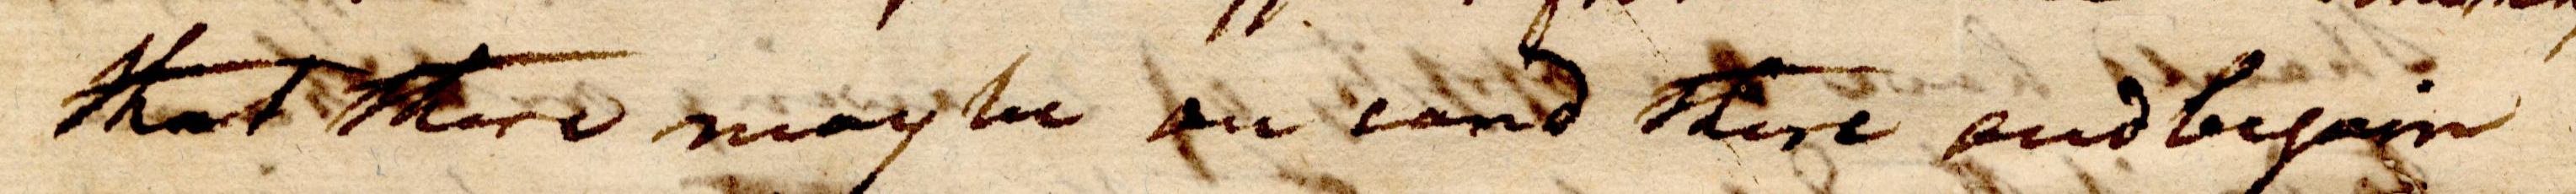that there maybe an land there and begain
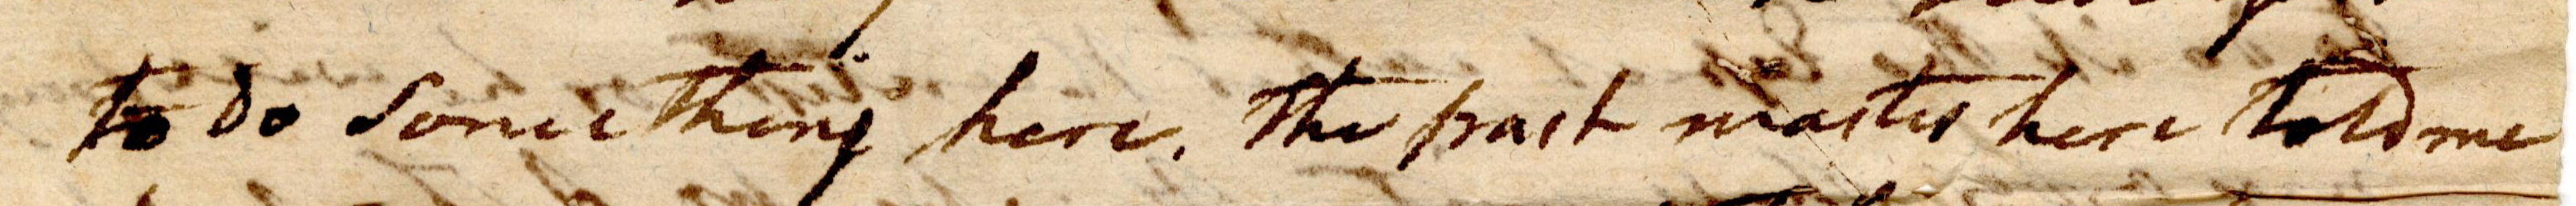to do something here, the past matter here told me
